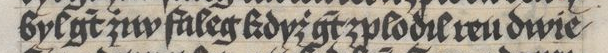byl ḡt żiw faleg kdyż ḡt zplodil reu dwie¬
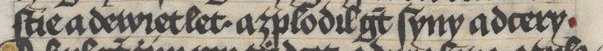ſtie a dewiet let.a zplodil ḡt ſyny a dcery.
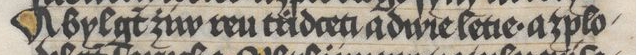A byl ḡt żn reu tṙidceti a dwie letie.a zplo¬
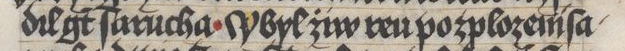dil ḡt ſarucha.Ybyl żiw reu pozplozeni ſa¬
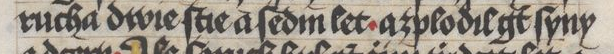rucha dwie ſtie a ſedm let.a zplodil ḡt ſyny
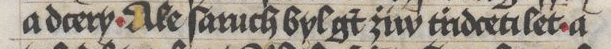a dcery.Ale ſaruch byl ḡt żiw tṙidceti let.a
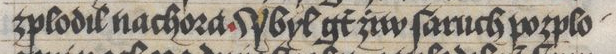zplodil nachora.Ybyl ḡt żiw ſaruch pozplo¬
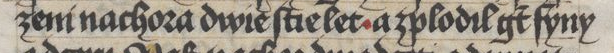zení nachora dwie ſtie let.a zplodil ḡt ſyny
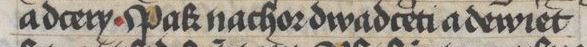a dcery.Pak nachor dwadceti a dewiet
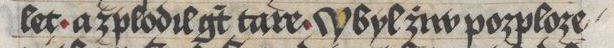let.a zplodil ḡt tare.Ybyl żn pozploze¬
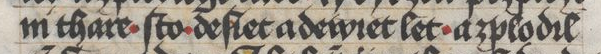n thare.ſto.deſiet a dewiet let.a zplodil
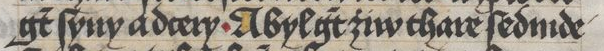ḡt ſyny a dcery.Abyl ḡt żiw thare ſedmde¬
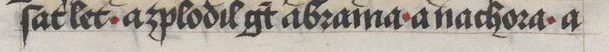ſat let.a zplodil ḡt abrama.a nachora.a
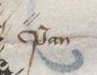Pan
